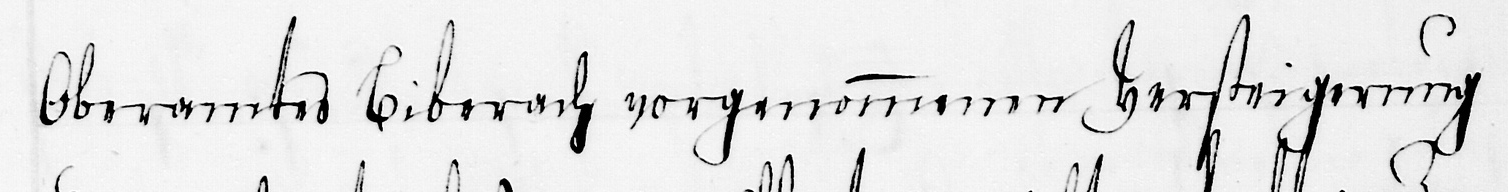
Oberamtes Biberach vorgenommenen Versteigerung
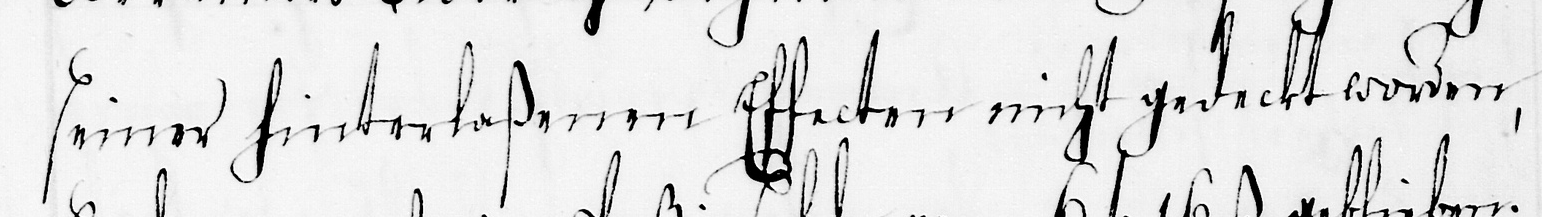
seiner hinterlaßenen Effecten nicht gedeckt worden,
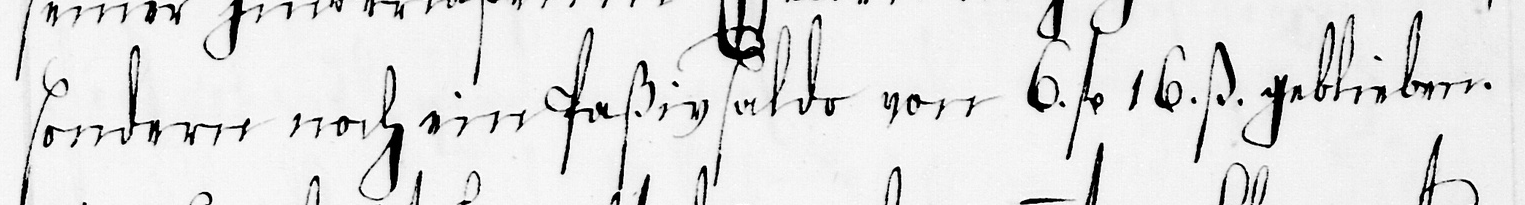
sondern noch ein Paßivsaldo von 6. fl. 16. ß. geblieben.
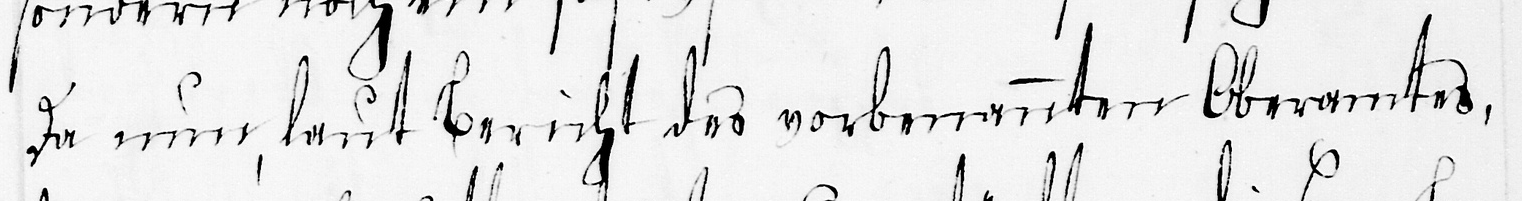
Da nun, laut Bericht des vorbenannten Oberamtes,
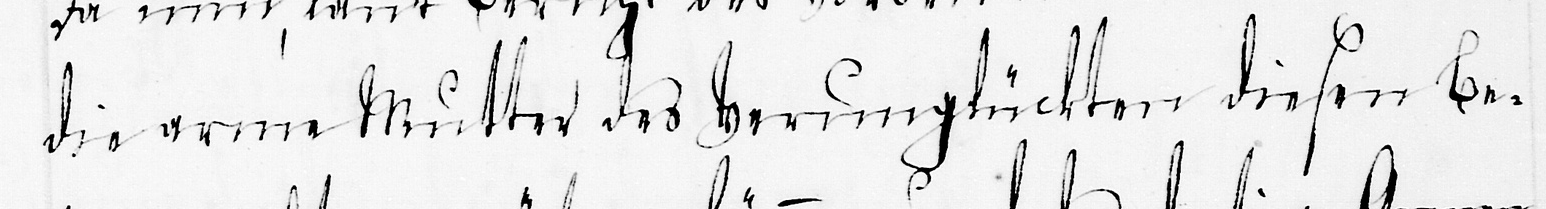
die arme Mutter des Verunglückten diesen Be¬
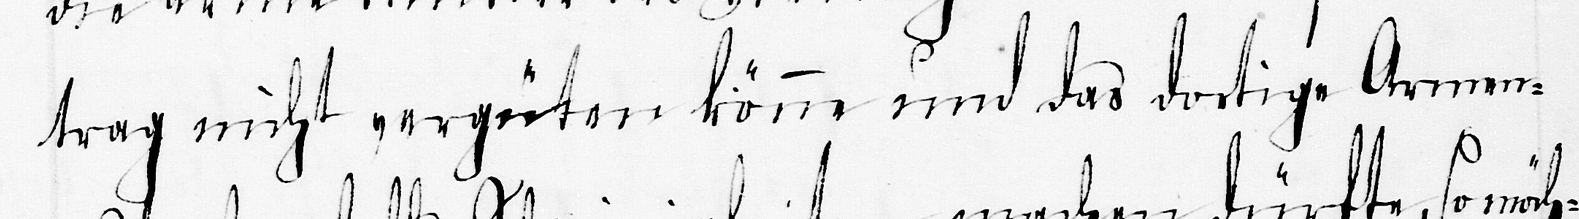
trag nicht vergüten könne und das dortige Armen¬
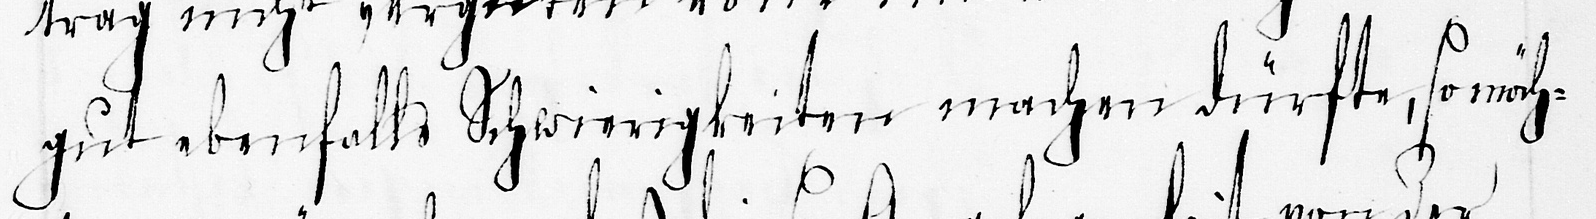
gut ebenfalls Schwierigkeiten machen dürfte, so möch¬
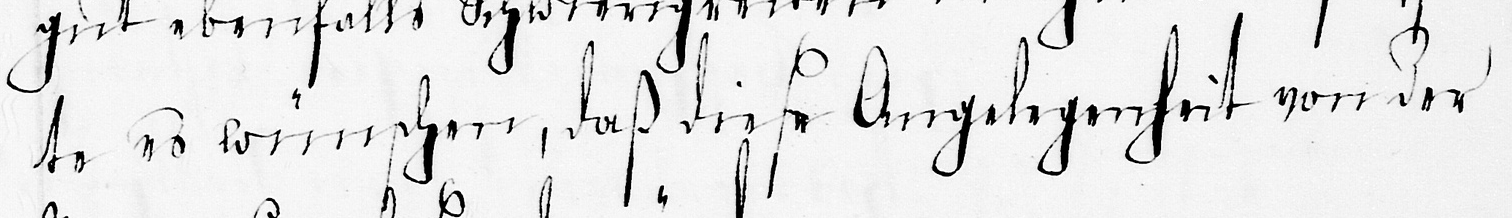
te es wünschen, daß diese Angelegenheit von der
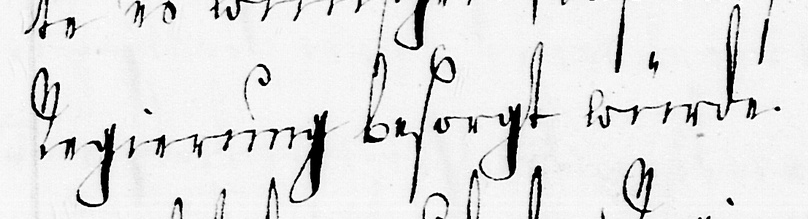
Regierung besorgt würde.
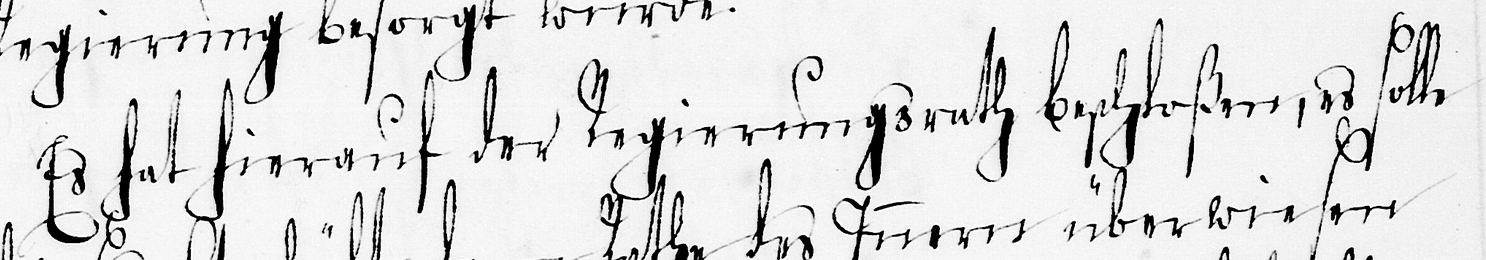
Es hat hierauf der Regierungsrath beschloßen, es
